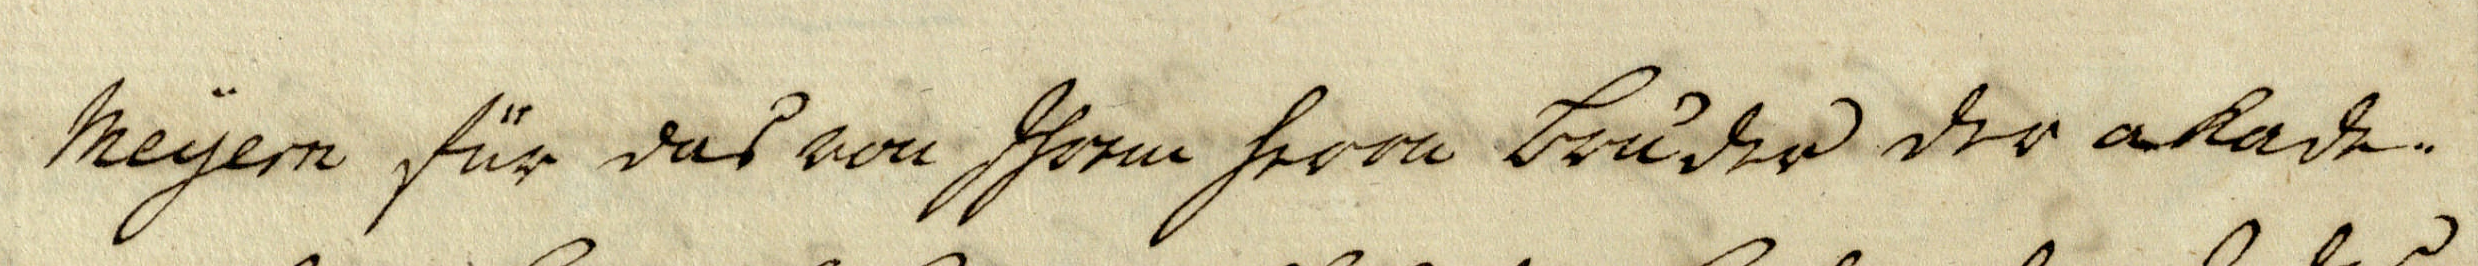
Meÿern für das von Ihrem Herrn Bruder der akade¬
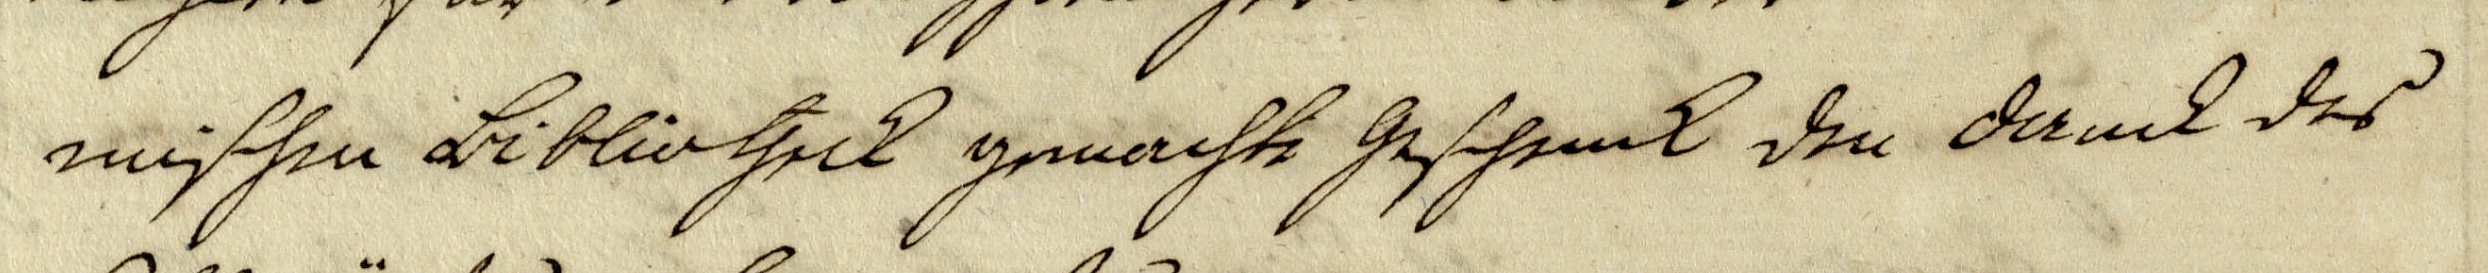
mischen Bibliotheck gemachte Geschenck den Danck des
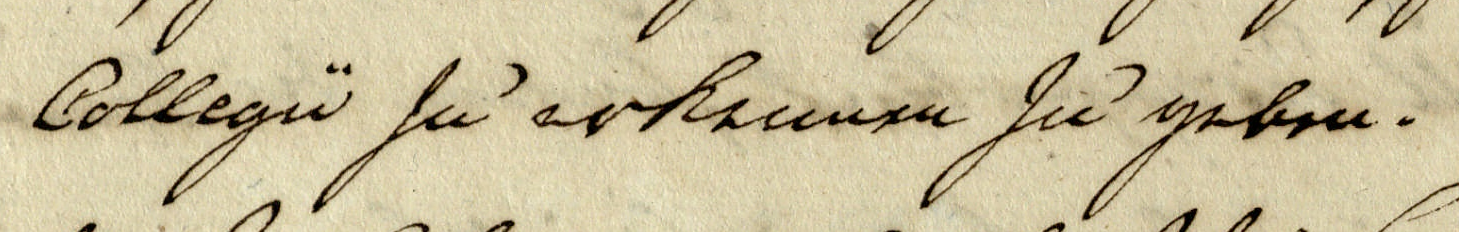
Collegii zu erkennen zu geben.
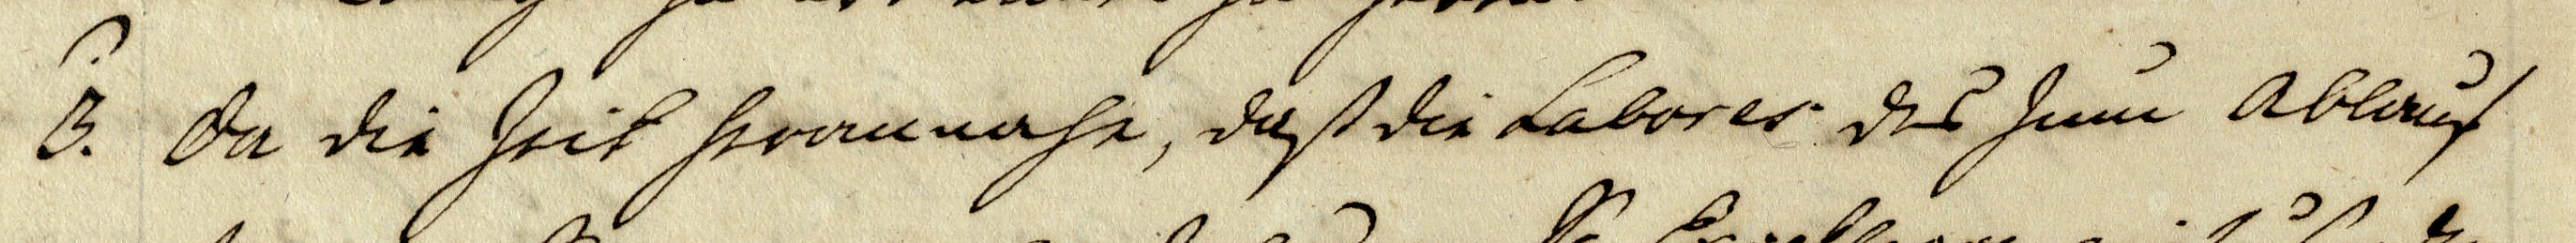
3. Da die Zeit herannahe, daß die Labores des zum Ablauf
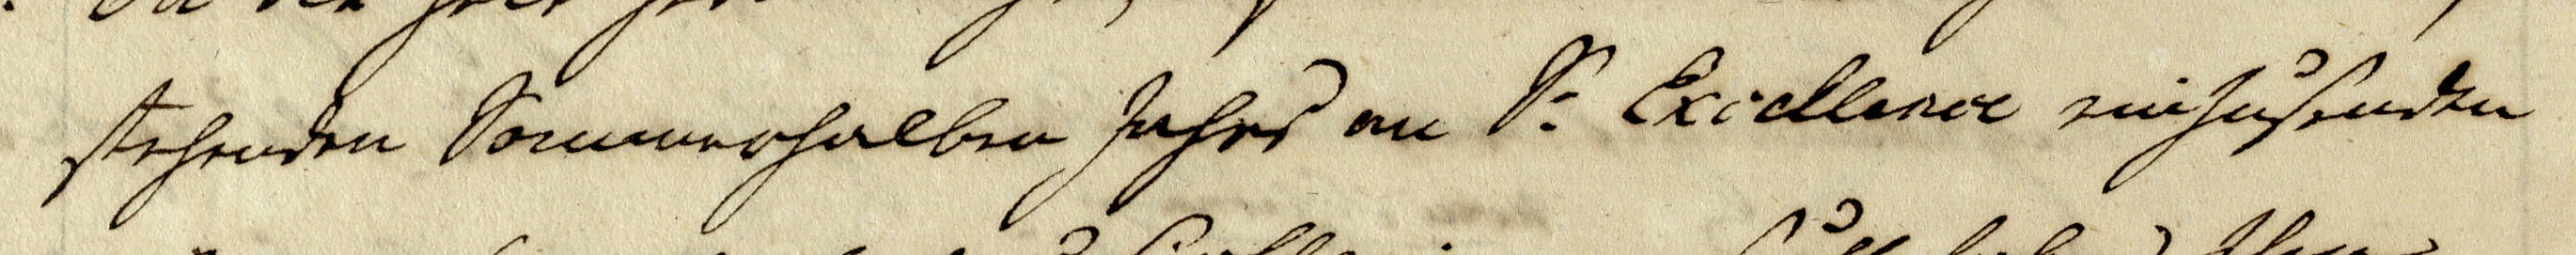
stehenden Sommerhalben Jahrs an Sr. Excellence einzusenden
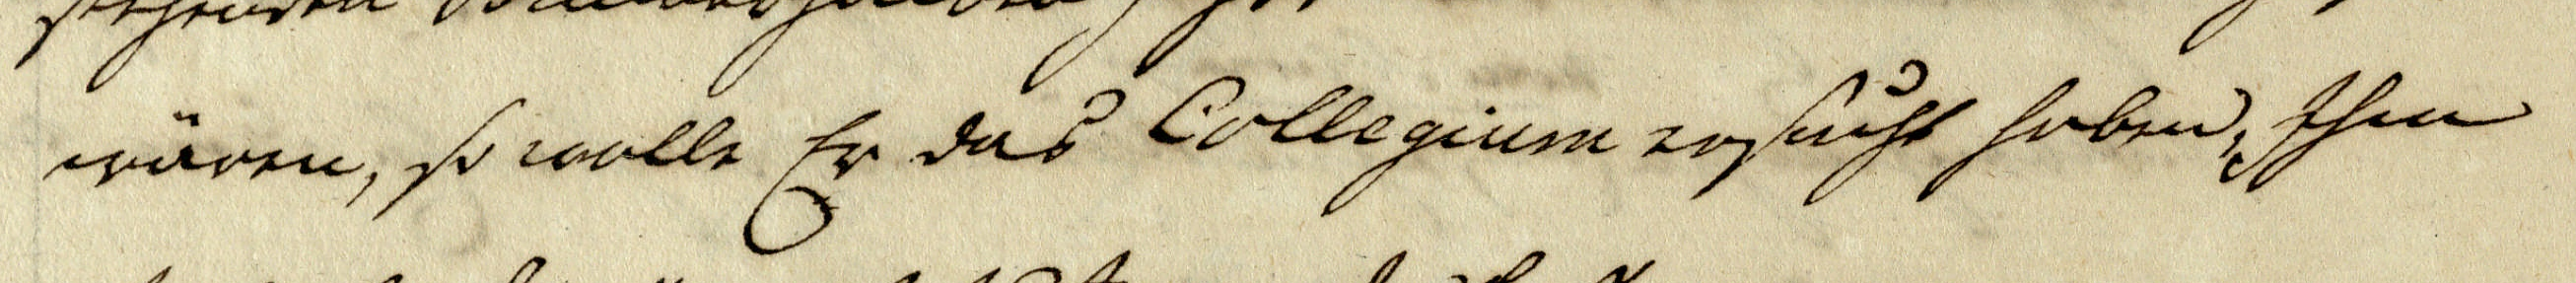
wären, so wolle Er das Collegium ersucht haben, Ihm
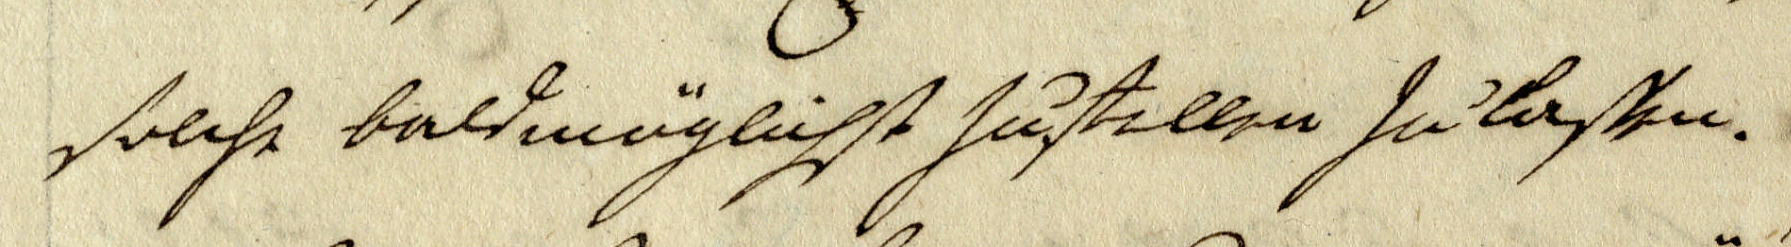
solche baldmöglichst zustellen zulassen.
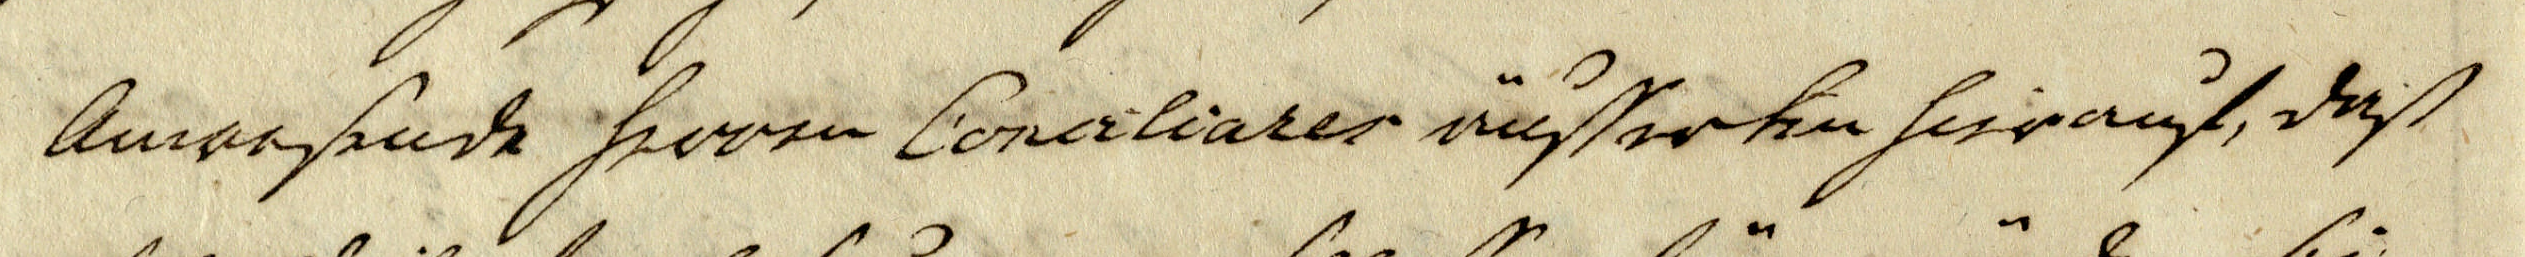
Anwesende Herren Conciliares äusserten hierauf, daß
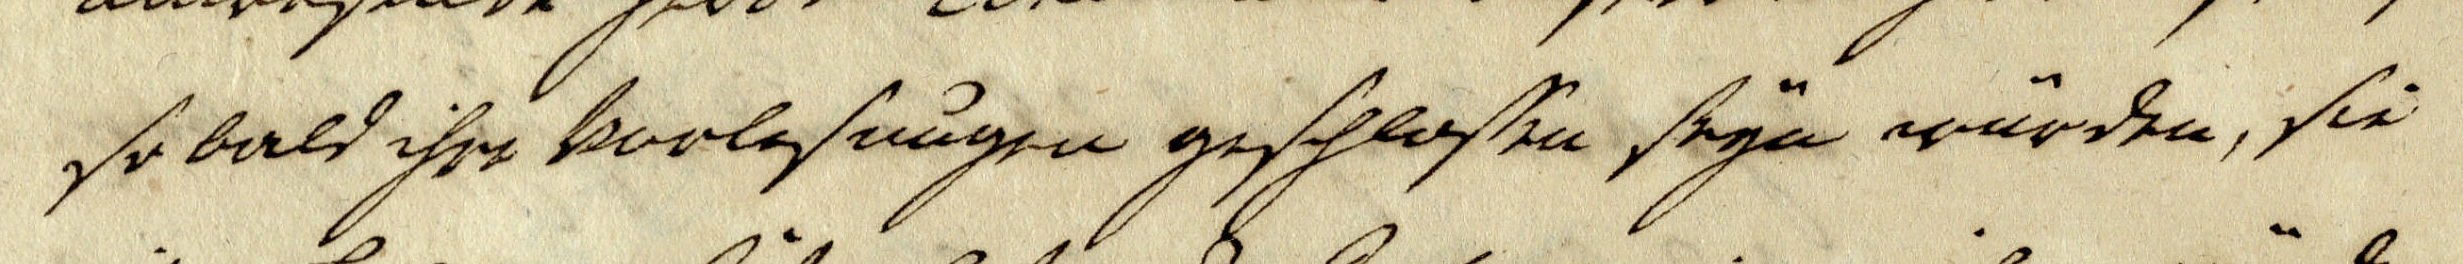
so bald ihre Vorlesungen geschlossen seÿn würden, sie
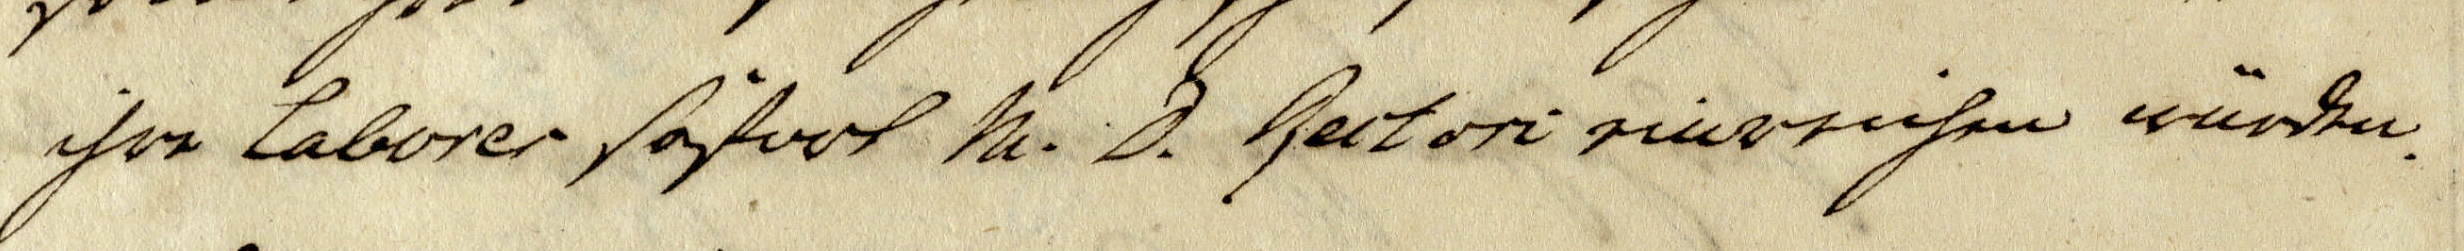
ihre Labores sofort M. D. Rectori einreichen würden.
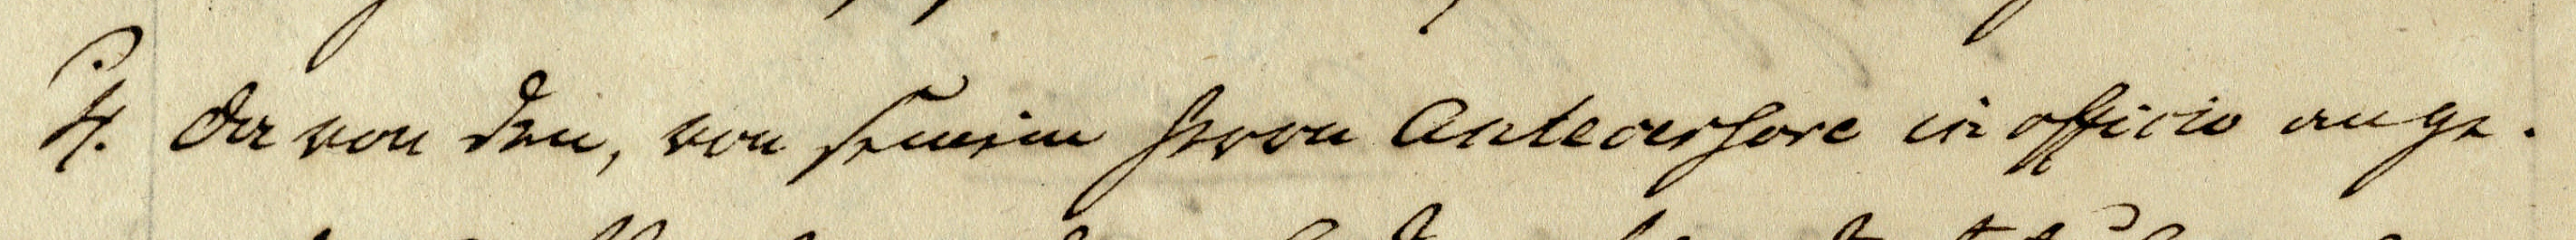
4. Da von den, von seinem Herrn Antecessore in officio ange¬
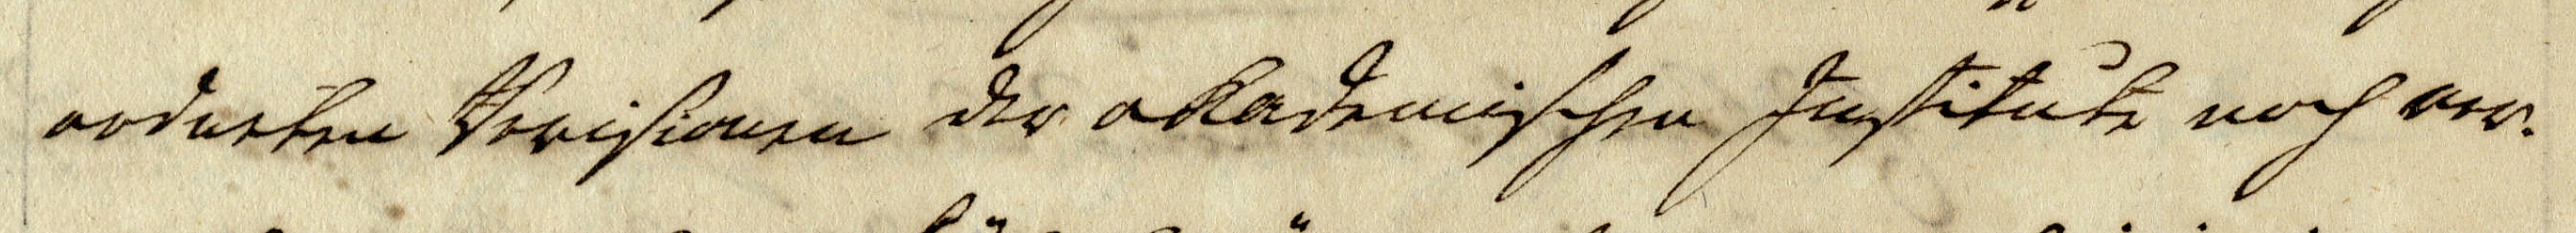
ordneten Revisionen der akademischen Institute noch ver¬
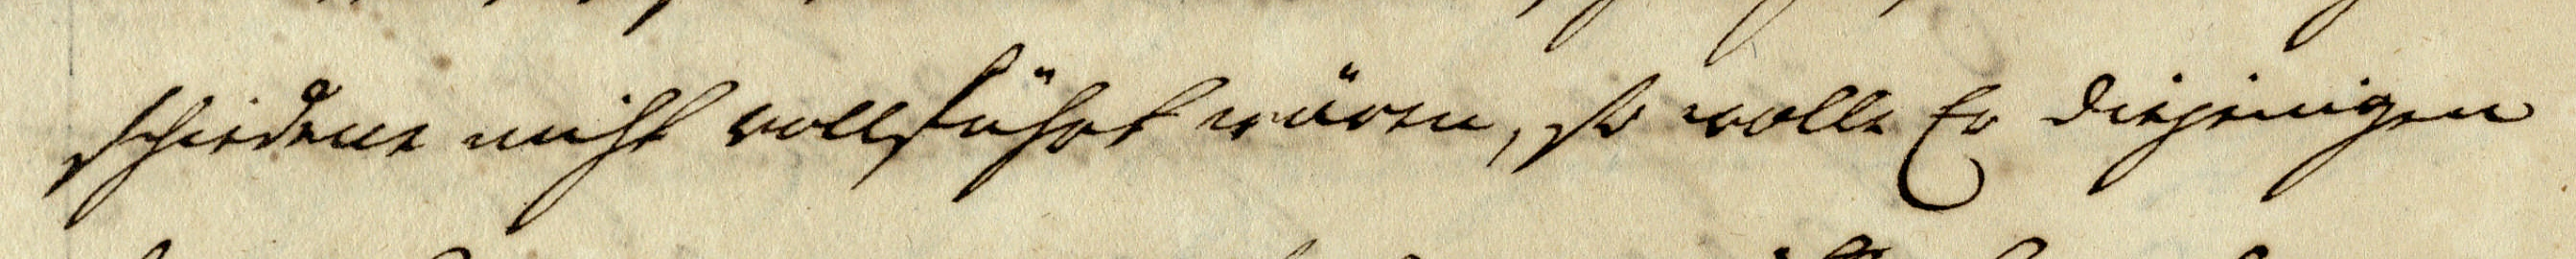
schiedene nicht vollführet wären, so wolle Er diejenigen
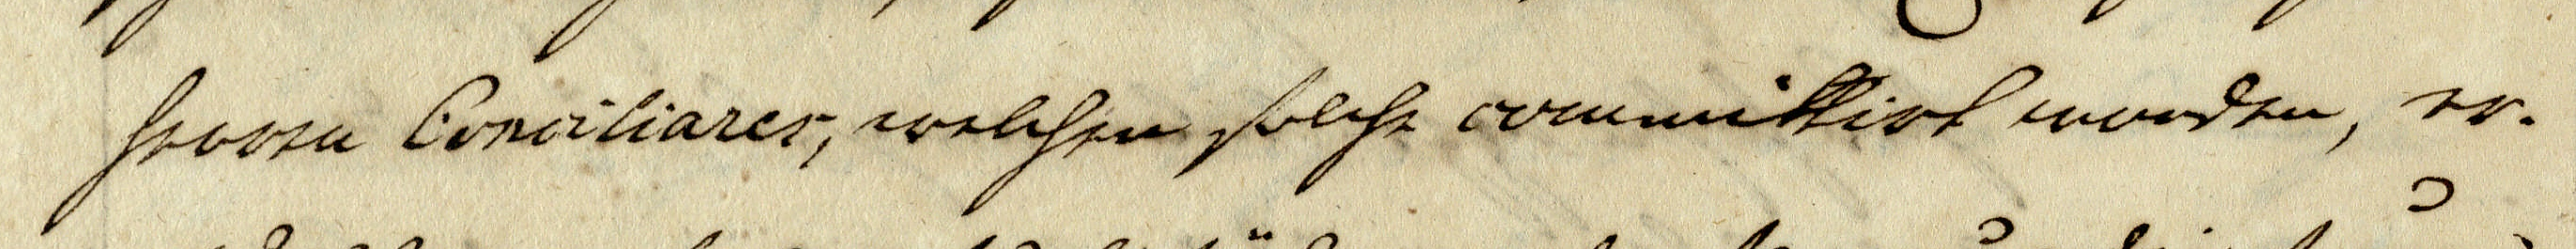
Herren Conciliares, welchen solche committirt worden, er¬
